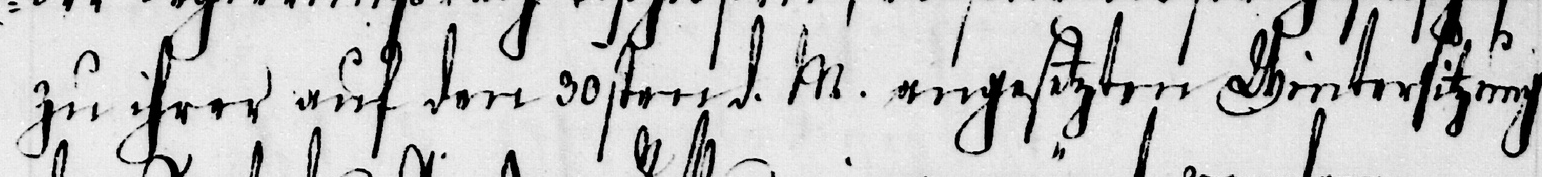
zu ihrer auf den 30ten d. M. angesetzten Wintersitzung
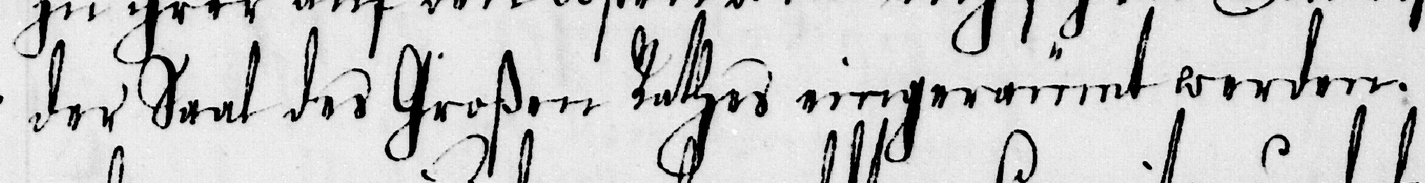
der Saal des Großen Rathes eingeräumt werden.
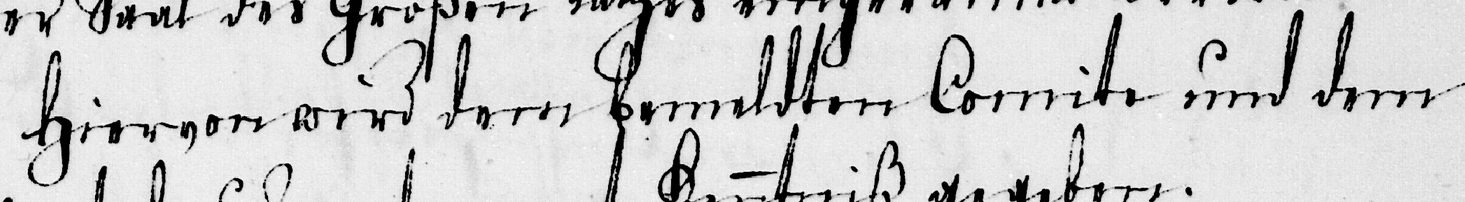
Hiervon wird dem bemeldten Comite und dem
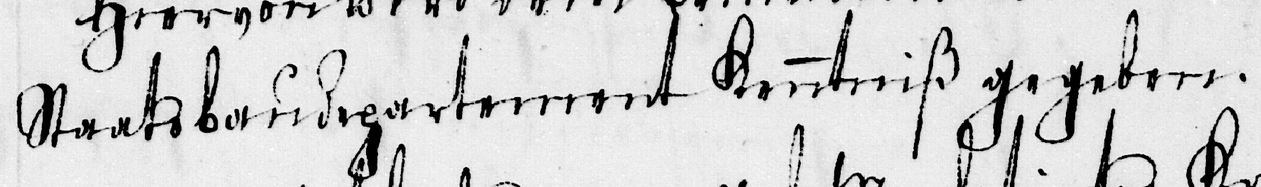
Staatsbaudepartement Kenntniß gegeben.
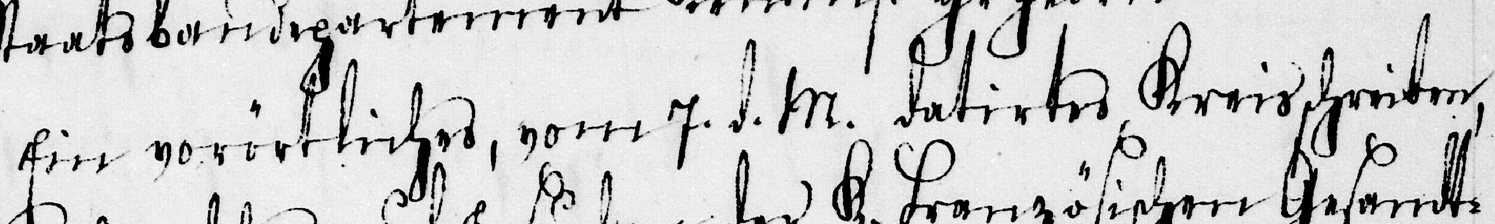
Ein vorörtliches, vom 7. d. M. datirtes Kreisschreiben,
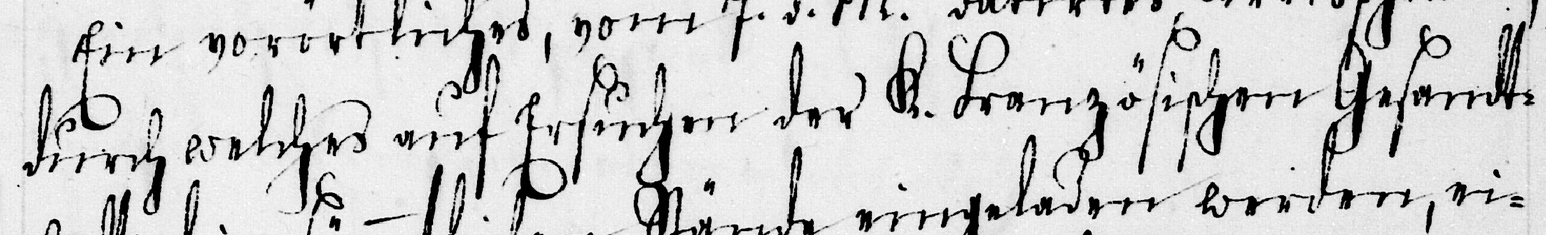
durch welches auf Ersuchen der K. Französischen Gesandt¬
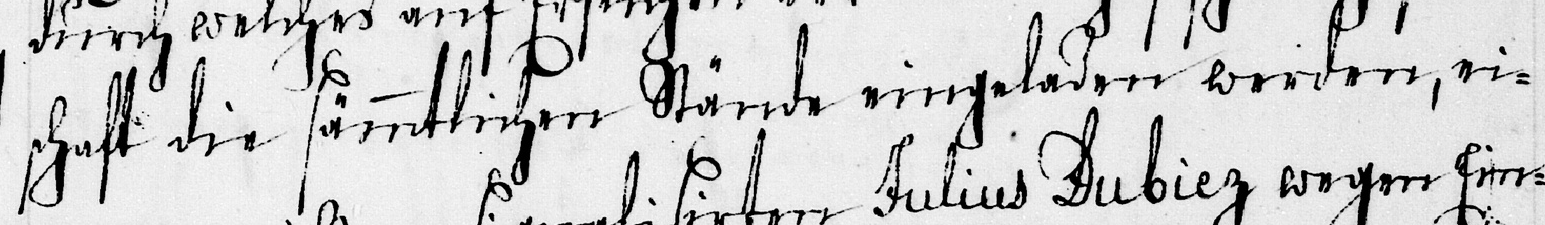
schaft die sämmtlichen Stände eingeladen werden, ei¬
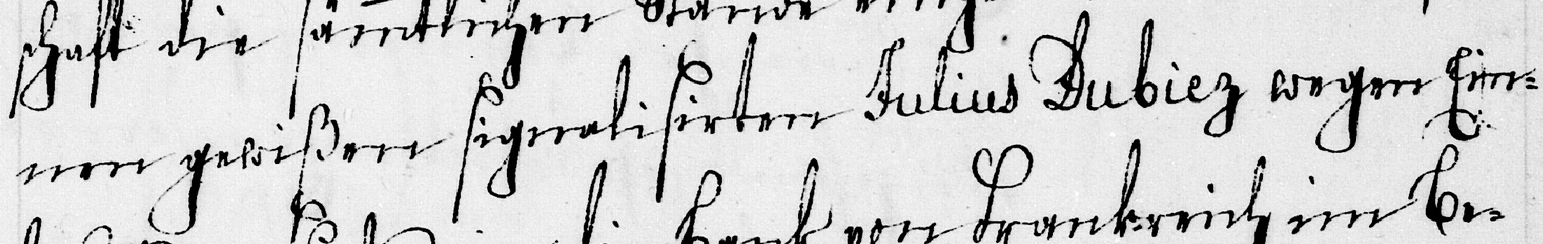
nen gewißen signalisirten Julius Dubiez wegen Ein¬
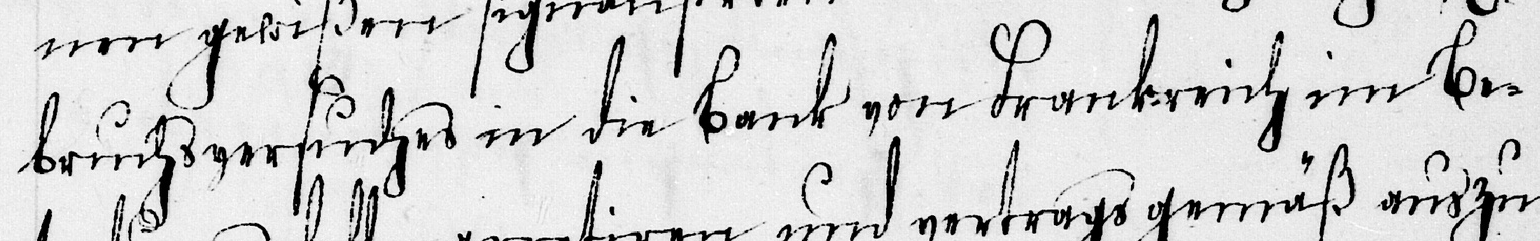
bruchsversuches in die Bank von Frankreich im Be¬
